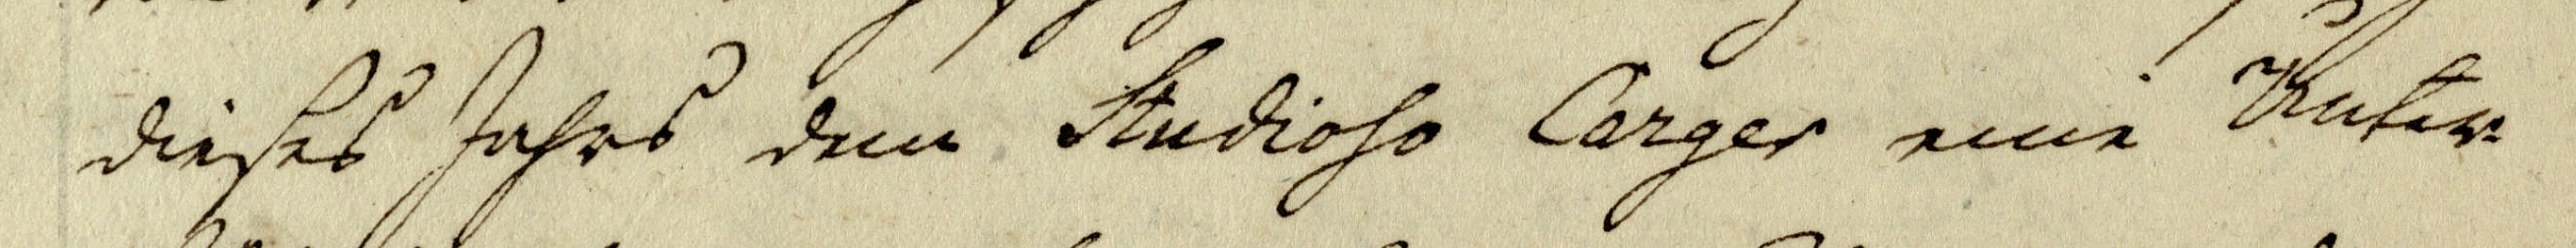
dieses Jahres dem Studioso Carger eine Unter¬
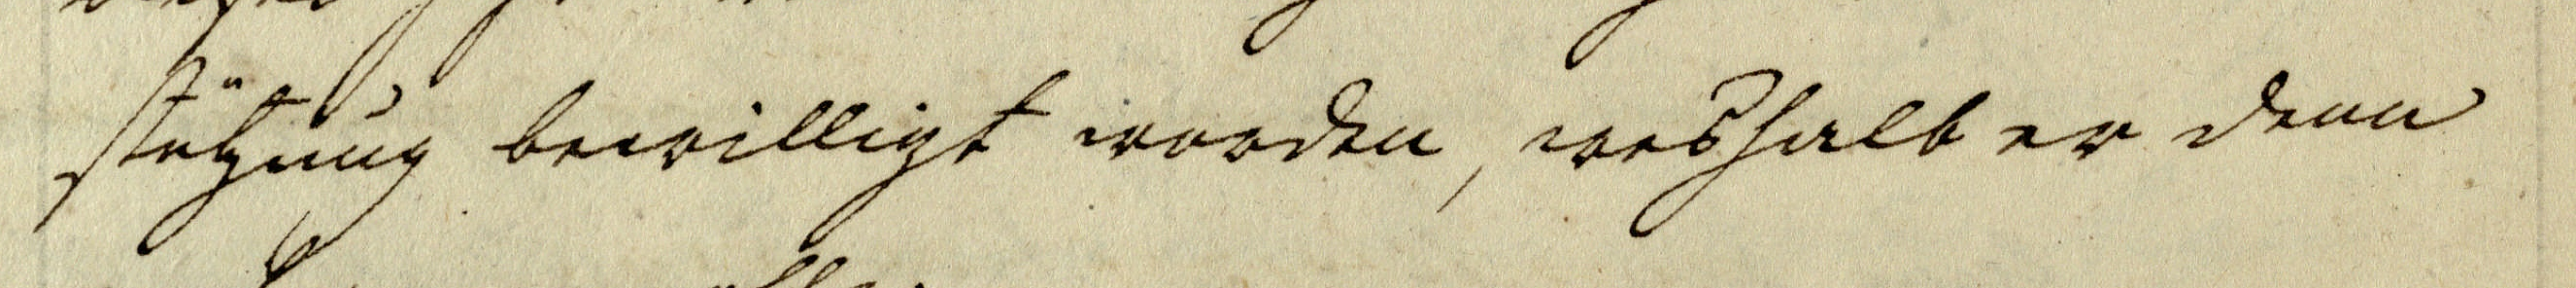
stützung bewilligt worden, weshalb er denn
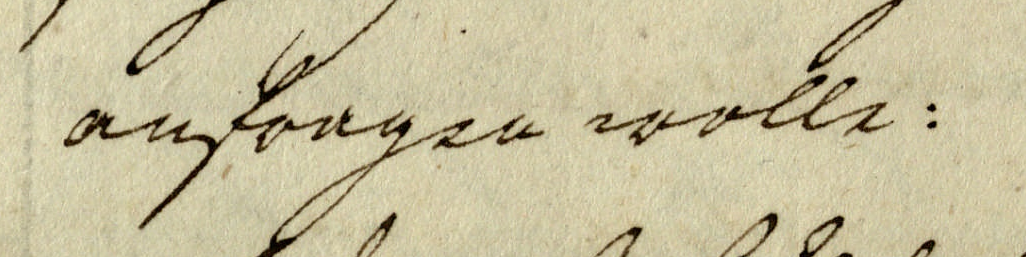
anfragen wolle:
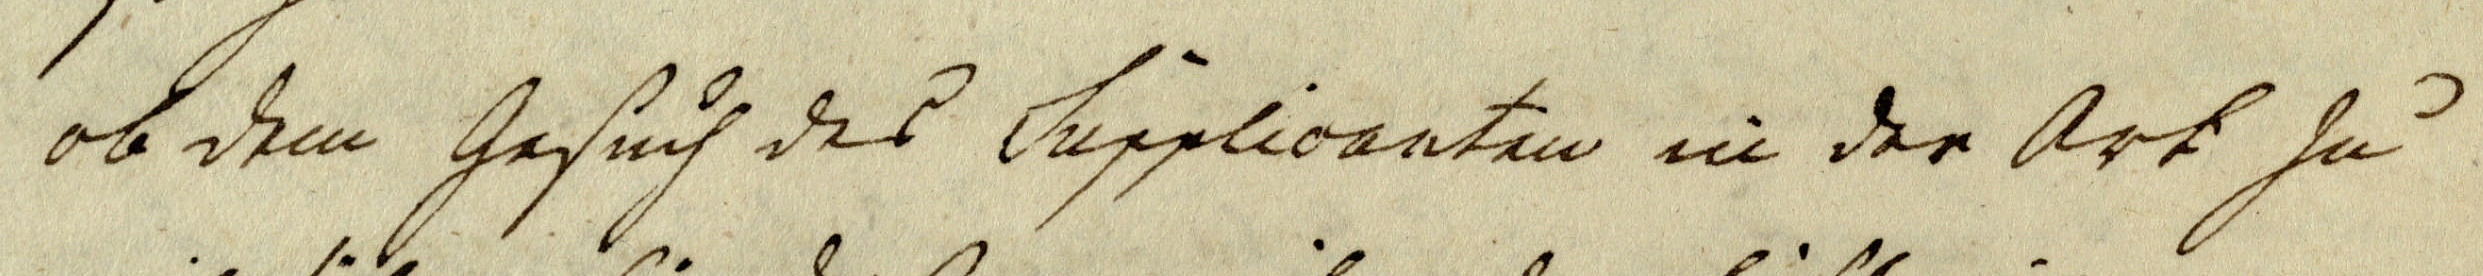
ob dem Gesuch des Supplicanten in der Art zu
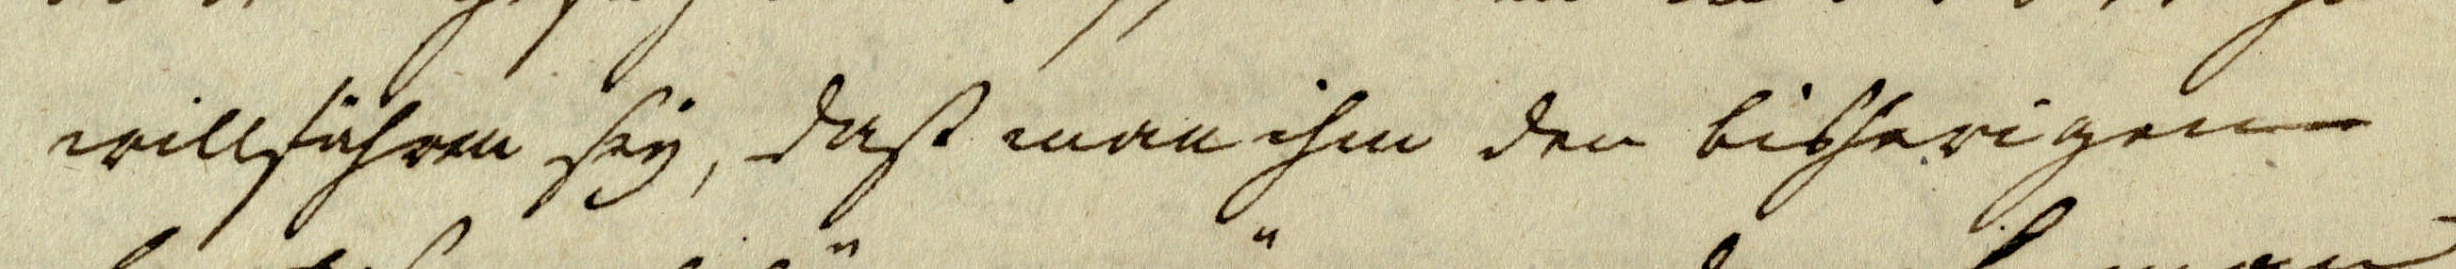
willfahren seÿ, daß man ihm den bisherigen
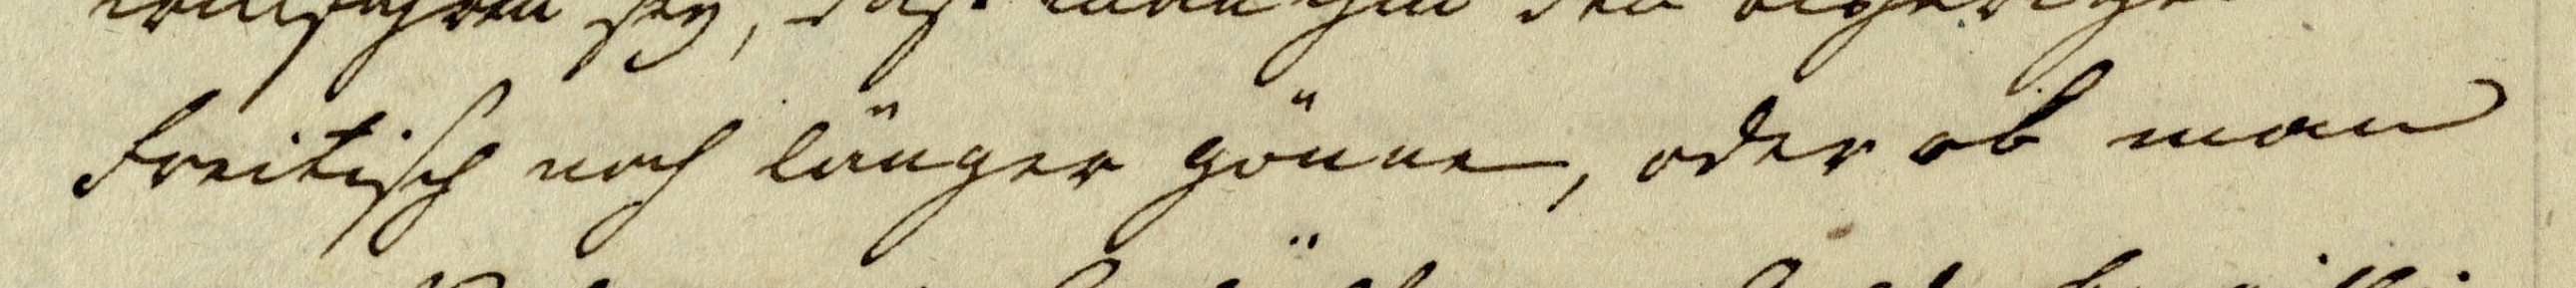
Freitisch noch länger gönne, oder ob man
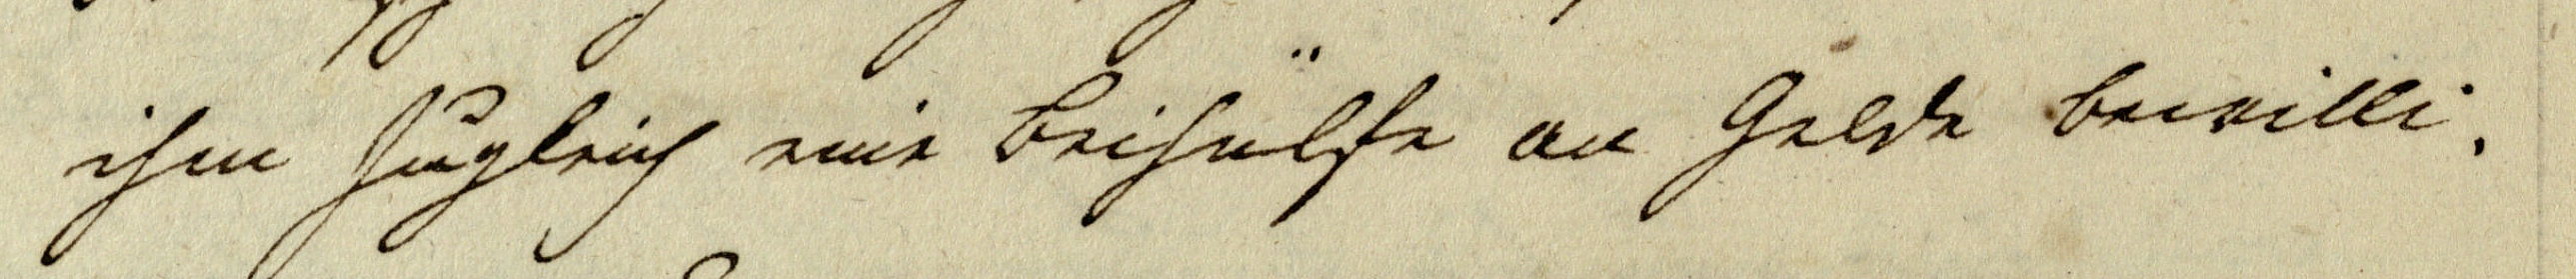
ihm zugleich eine Beihülfe an Gelde bewilli¬
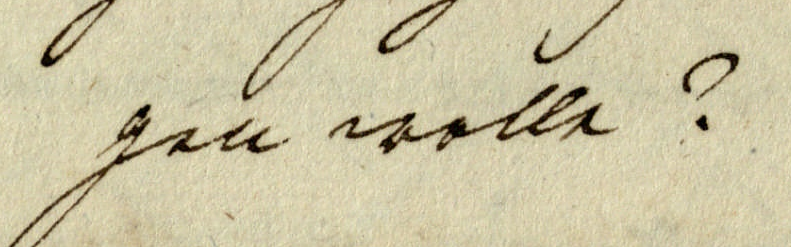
gen wolle?
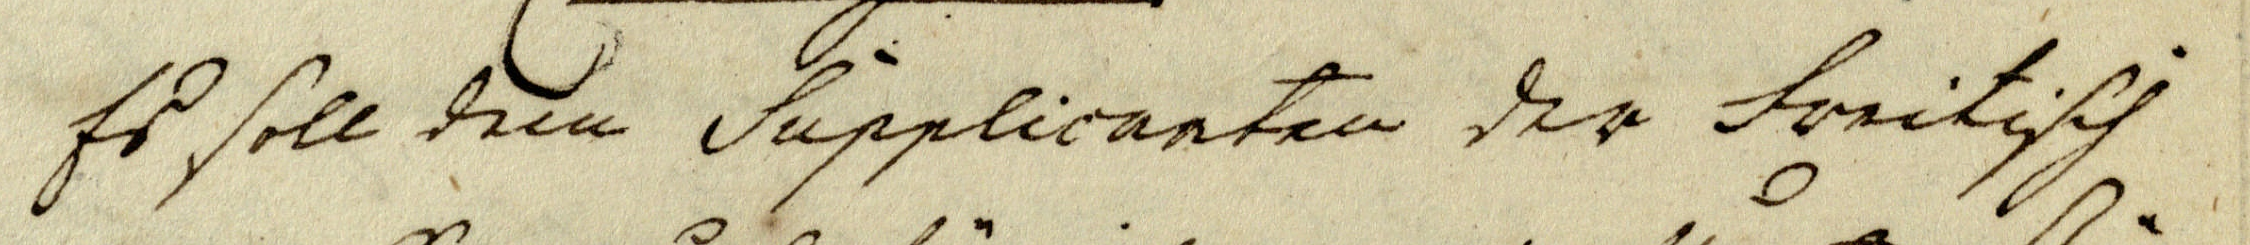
Es soll dem Supplicanten der Freitisch
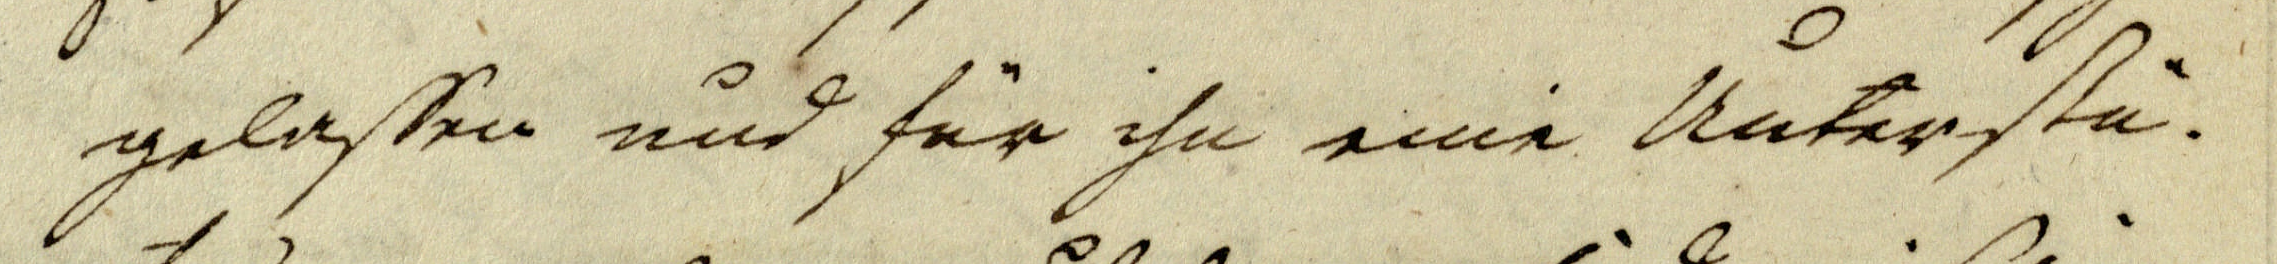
gelassen und für ihn eine Unterstü¬
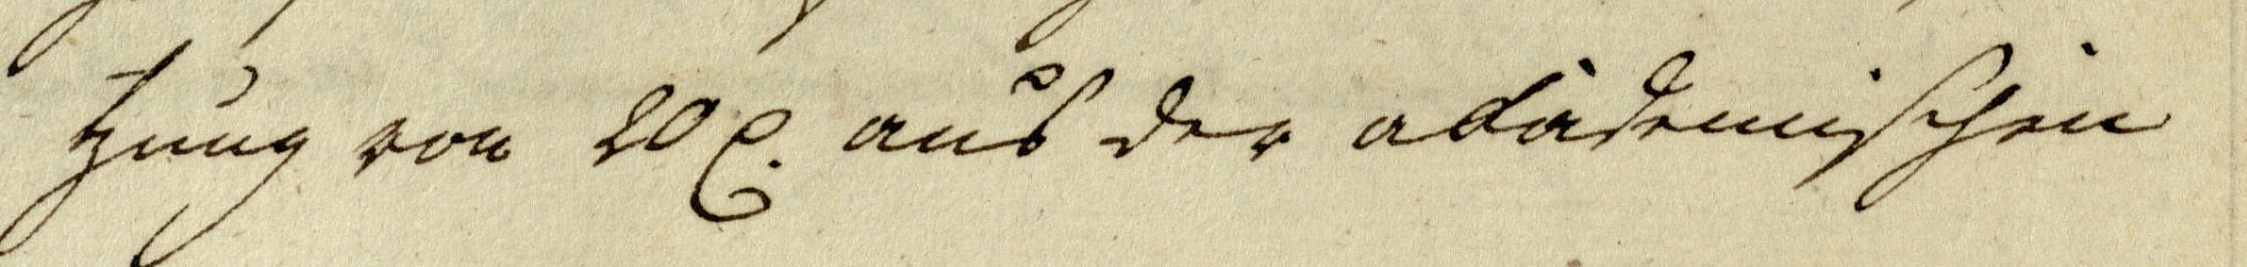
tzung von 20 l. aus der akademischen
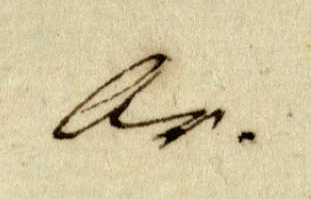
Ar¬
